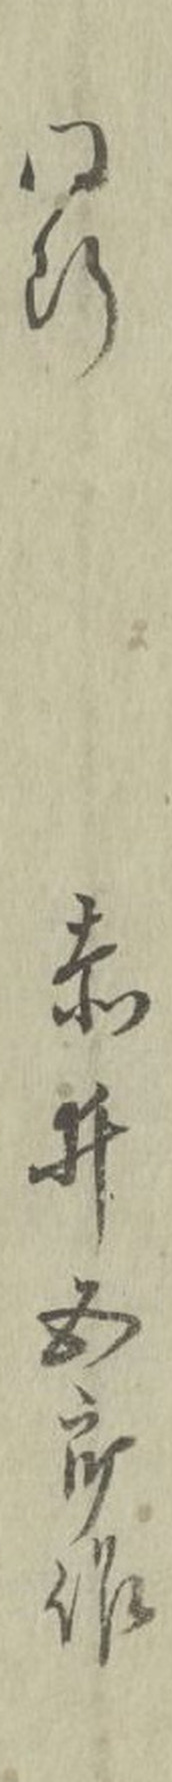同断赤井五郎作
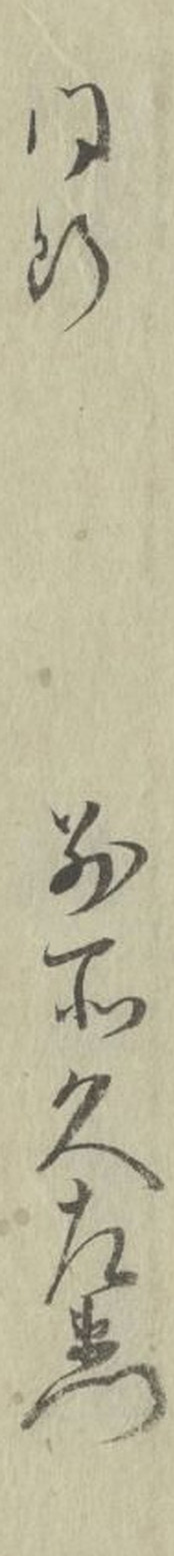同断別所久左衛門
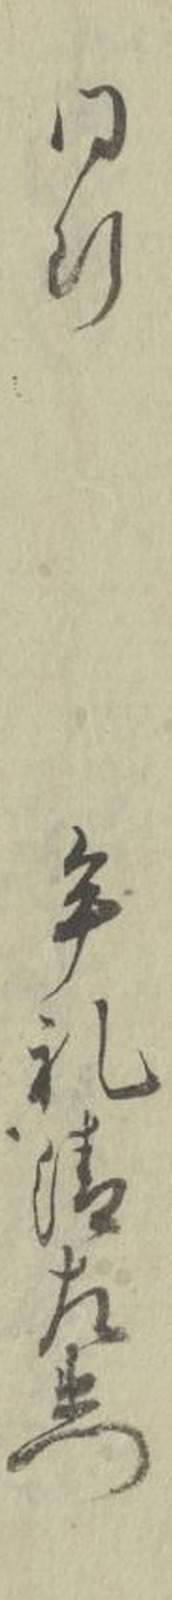同断牟礼清左衛門
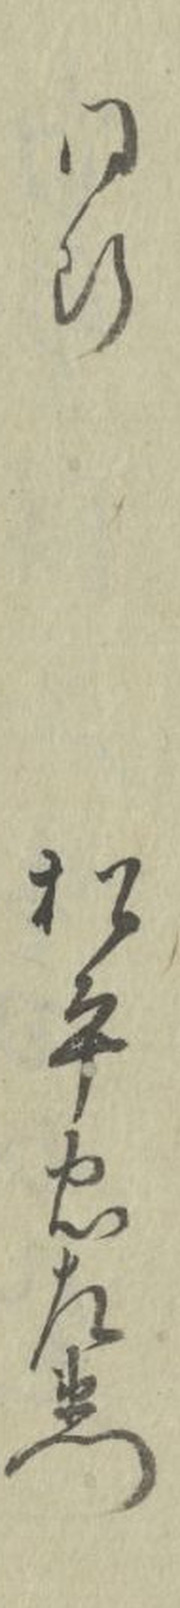同断松平忠左衛門
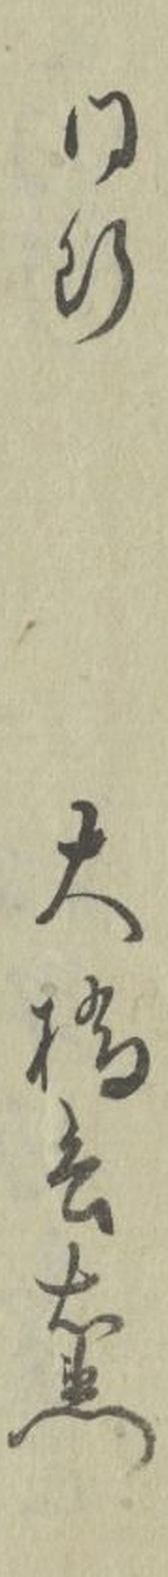同断大橋言右衛門

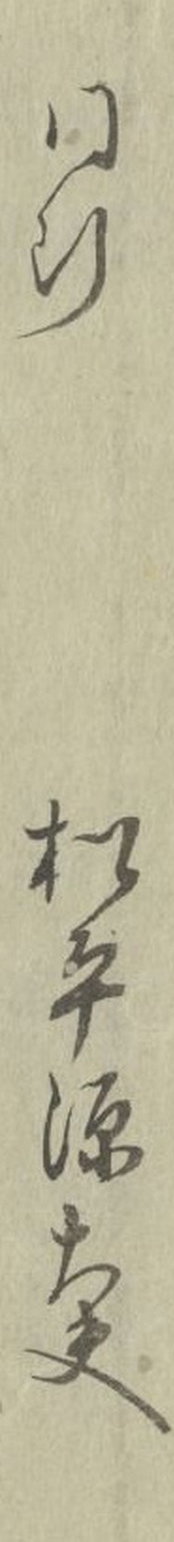同断松平源大夫
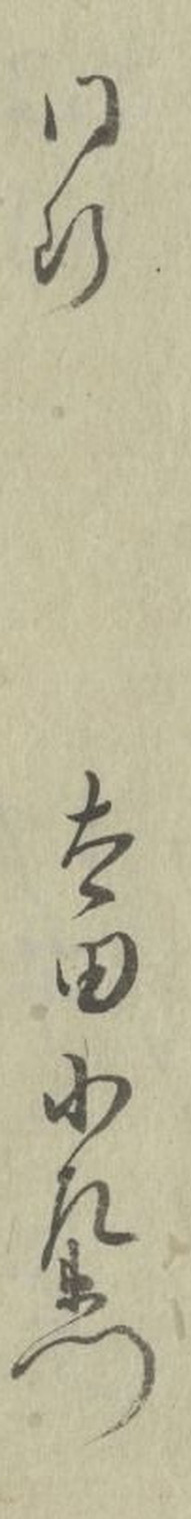同断太田小左衛門
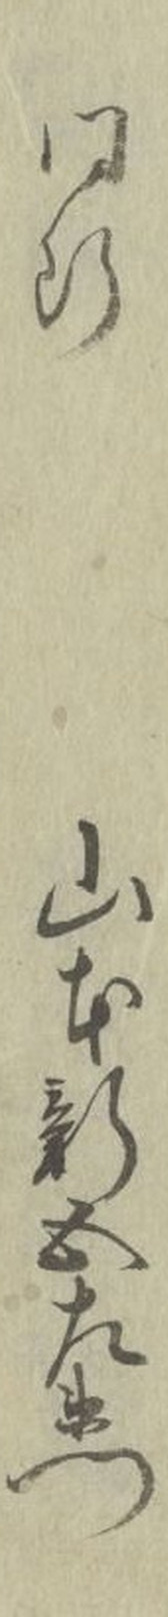同断山本新五左衛門
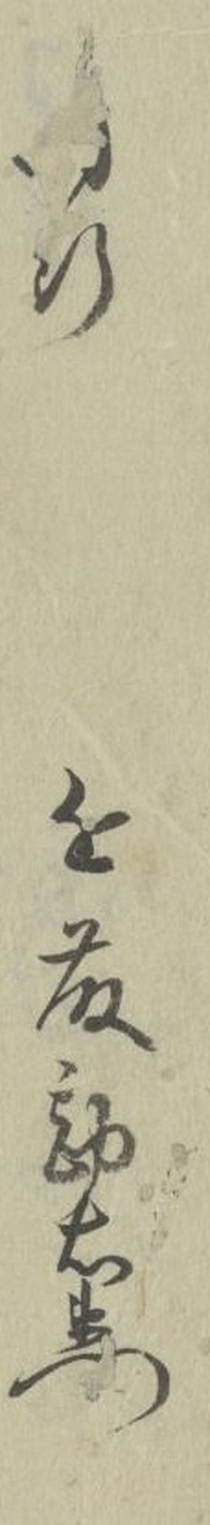同断近藤勘右衛門
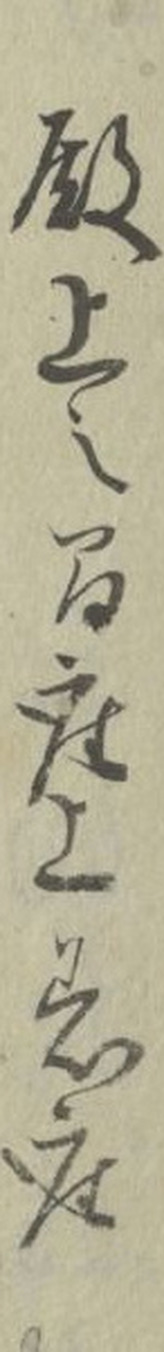殿上之間座上着座
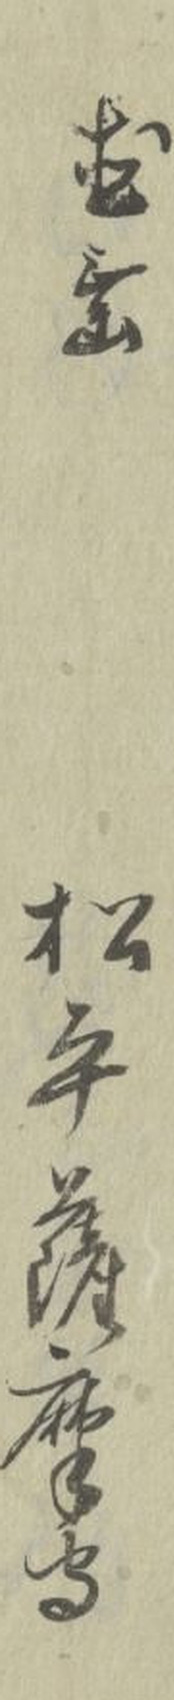直垂松平薩摩守
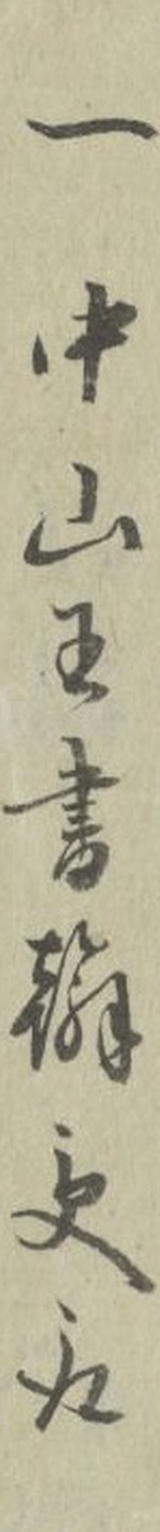一中山王書翰受取
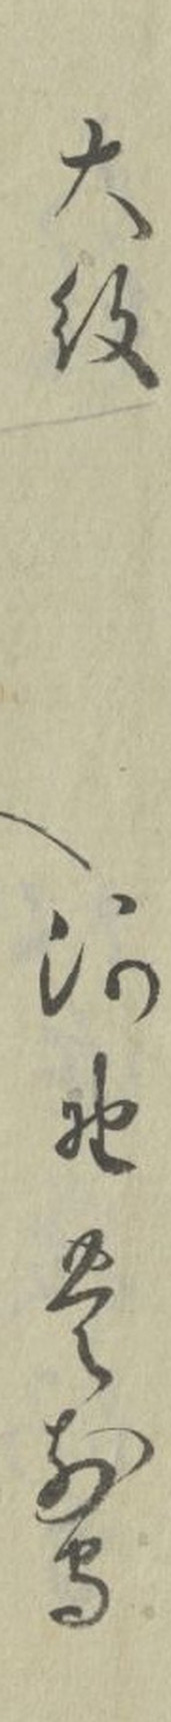大紋河野豊前守
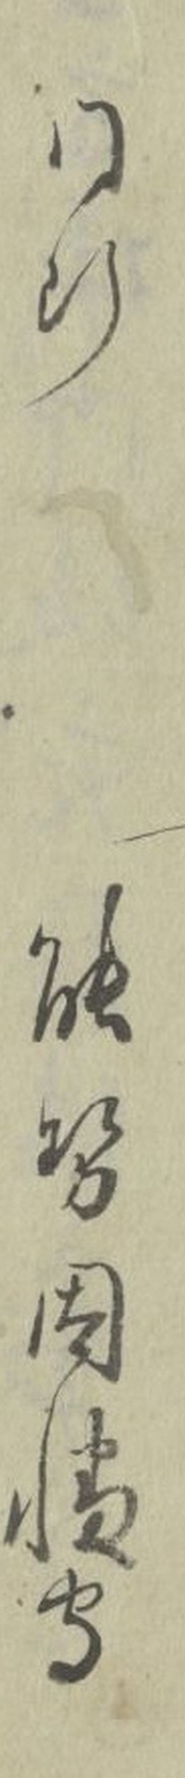同断能勢因幡守

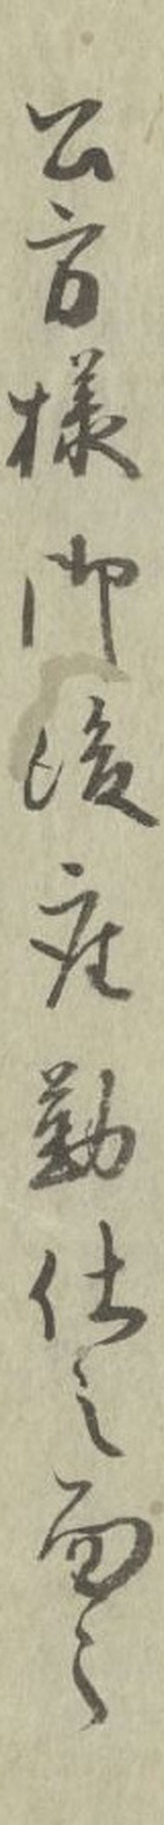公方様御後座勤仕之面々
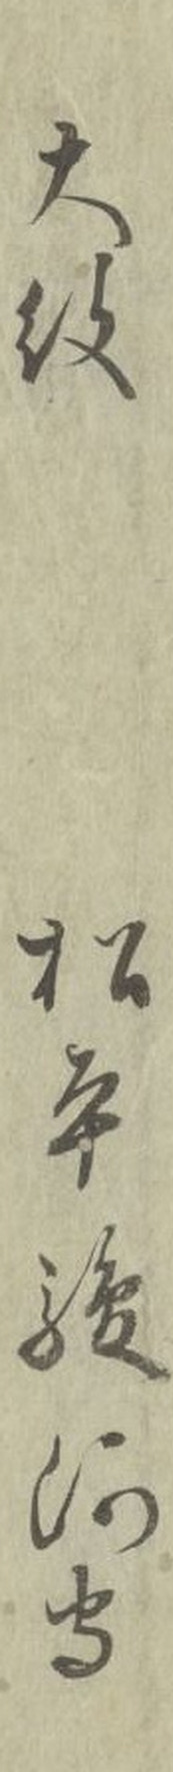大紋松平駿河守
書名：琉球来朝記 自八至十四終
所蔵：University of the Ryukyus Library
